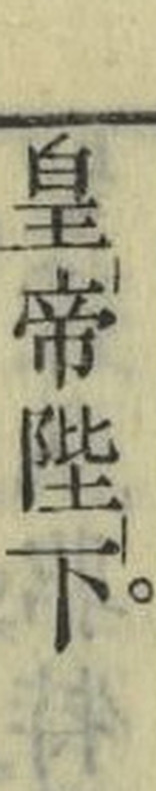皇-帝陛-下。
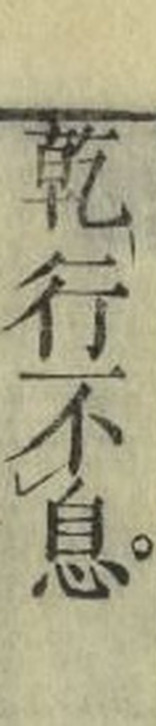乾-行不息。

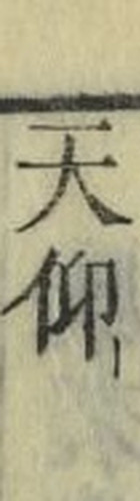天仰-
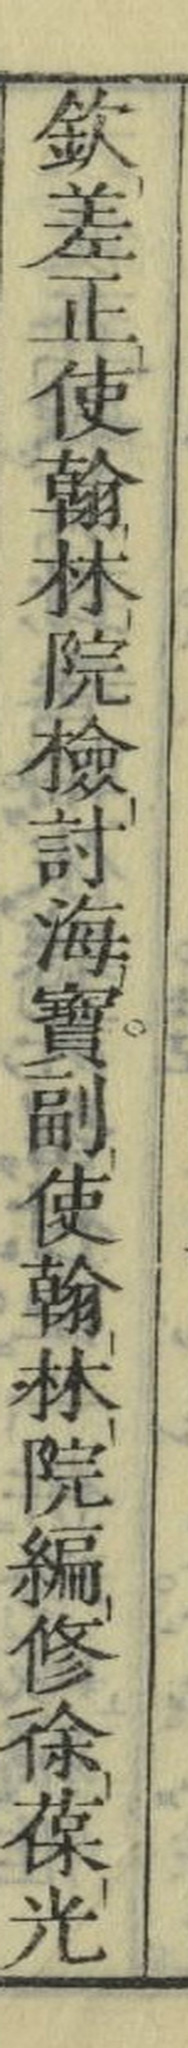欽-差正-使翰-林-院検-討海-宝。副-使翰-林-院編-修徐-葆-光

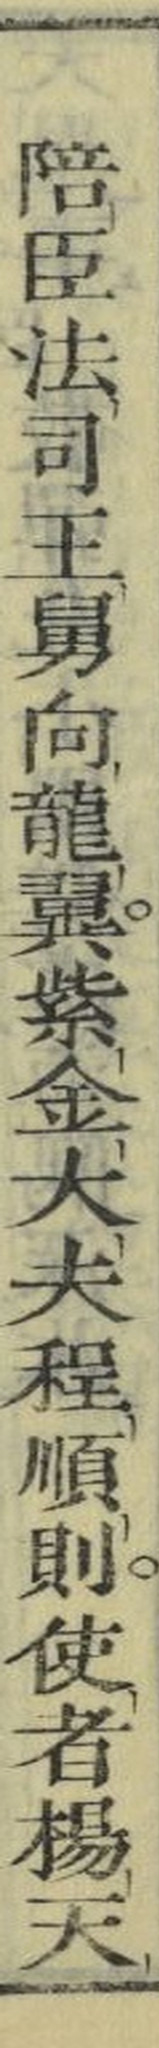陪-臣法-司王-舅向-竜-翼。紫-金-大-夫程-順-則。使-者楊-天-

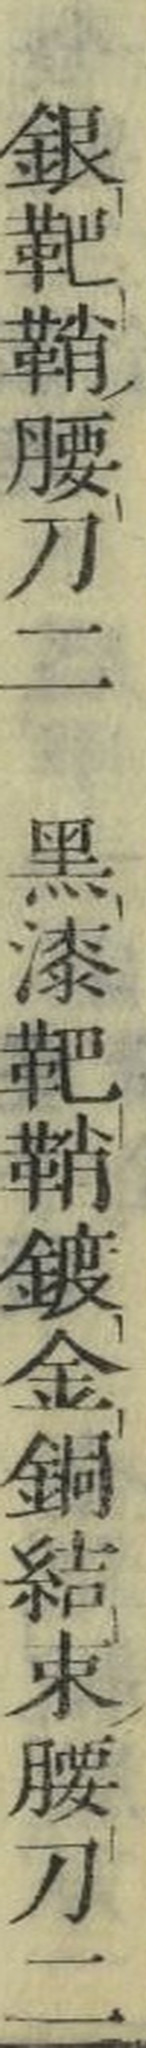銀-靶-鞘腰-刀二黑-漆靶-鞘鍍-金-銅結-束腰-刀二
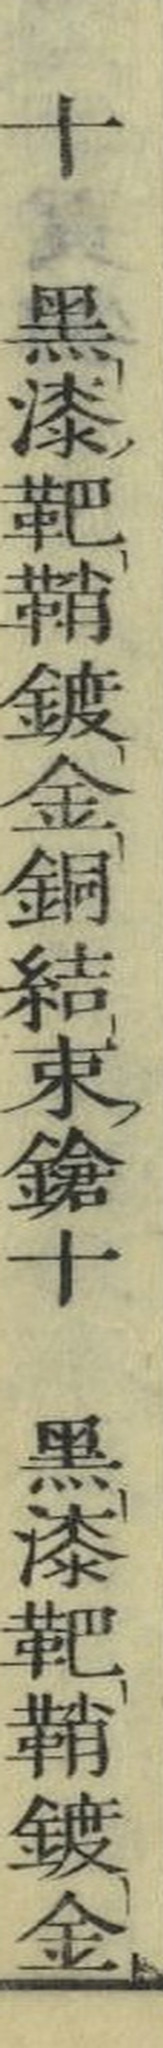十黒-漆靶-鞘鍍-金-銅結-束鎗十黒-漆靶-鞘鍍-金-
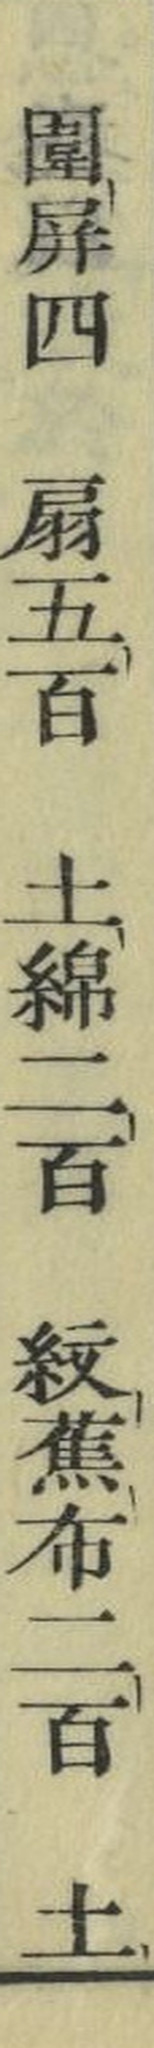囲-屏四扇五-百土-綿二-百紋-蕉-布二-百土-
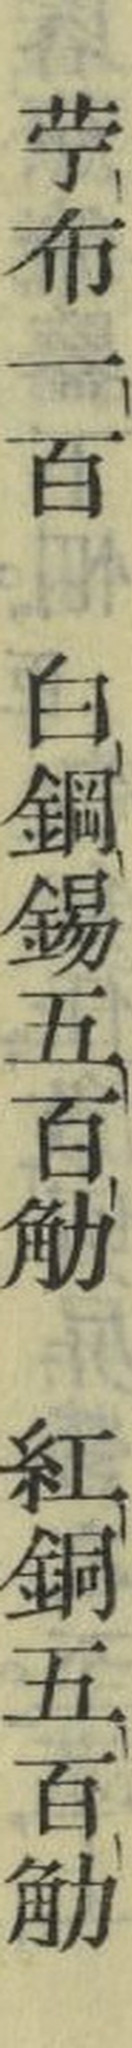苧-布一-百白-鋼-錫五-百-觔紅-銅五-百-觔
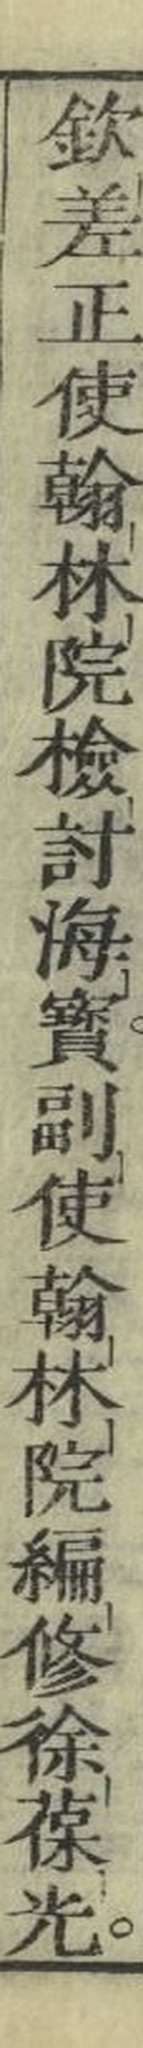欽-差正-使翰-林-院検-討海-宝。副-使翰-林-院編-修徐-葆-光。

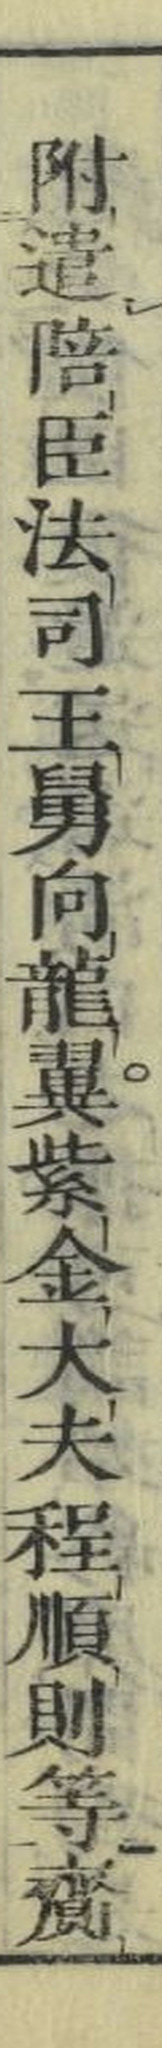附-遣陪-臣法-司王-舅向-竜-翼。紫-金-大-夫程-順-則等齎-
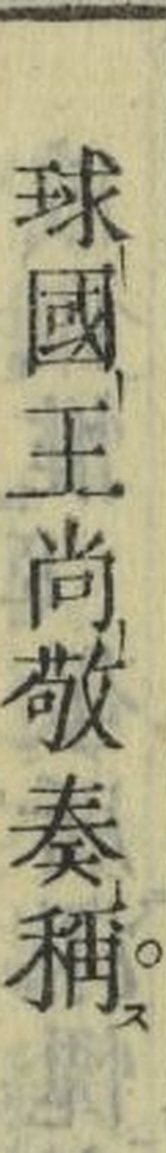球-国-王尚-敬奏-称。
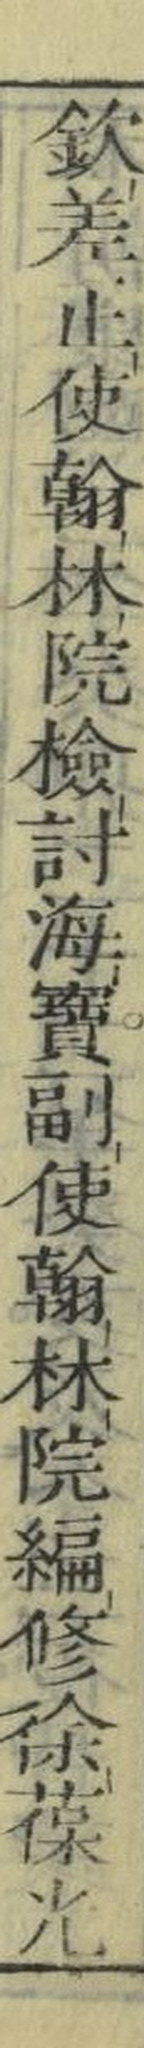欽-差正-使翰-林-院検-討海-宝。副-使翰-林-院編-修徐-葆光
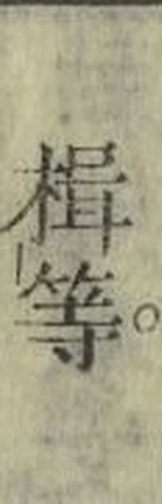楫-等。

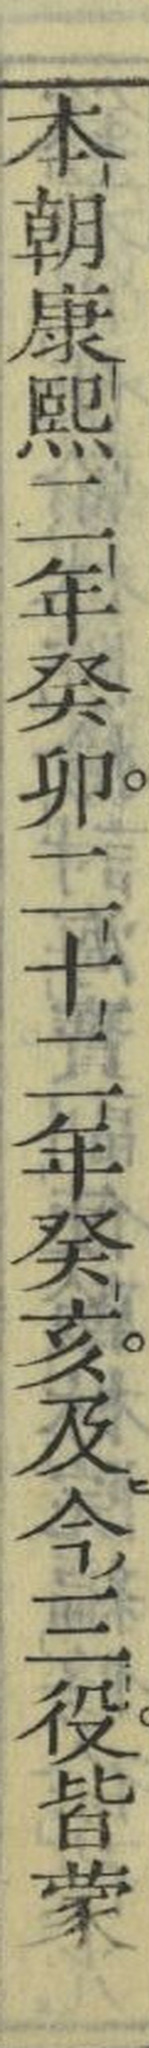本-朝康-熙二-年癸卯。二-十-二-年癸-亥。及今三-役。皆蒙
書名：中山伝信録 巻二
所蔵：University of the Ryukyus Library
